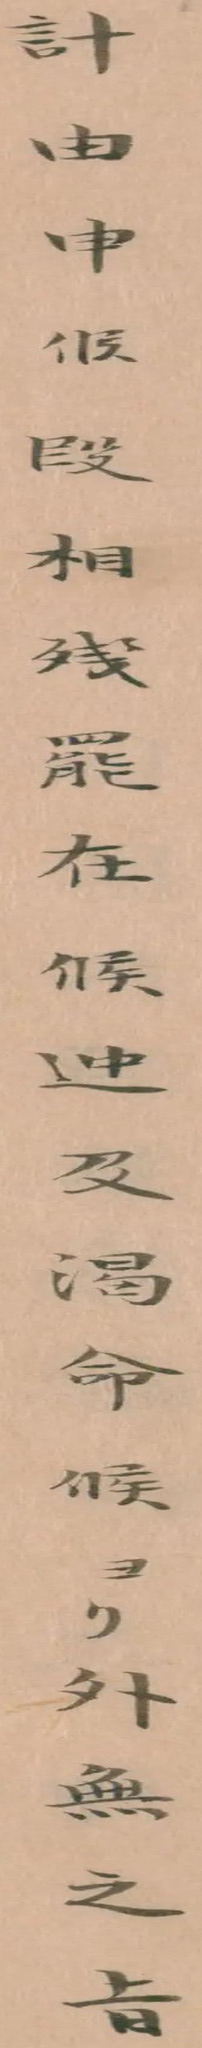計由申候段相残罷在候迚及渇命候ヨリ外無之旨
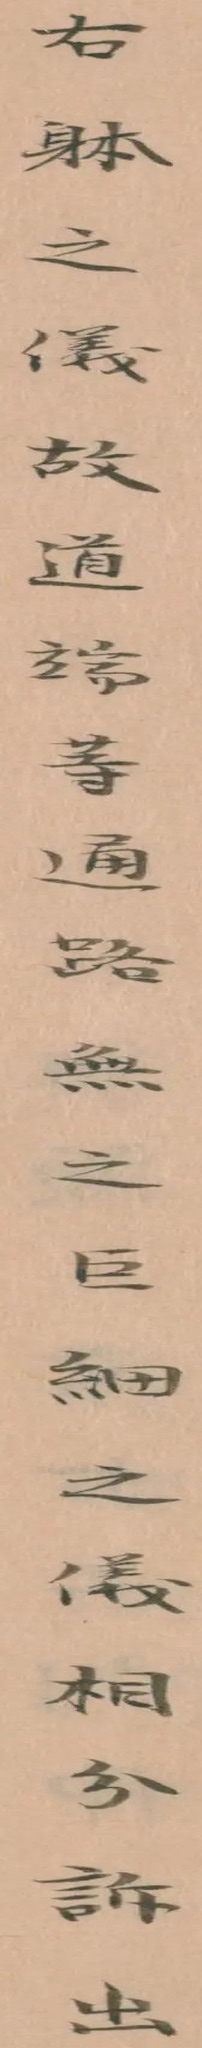右体之儀故道端等通路無之巨細之儀相分訴出
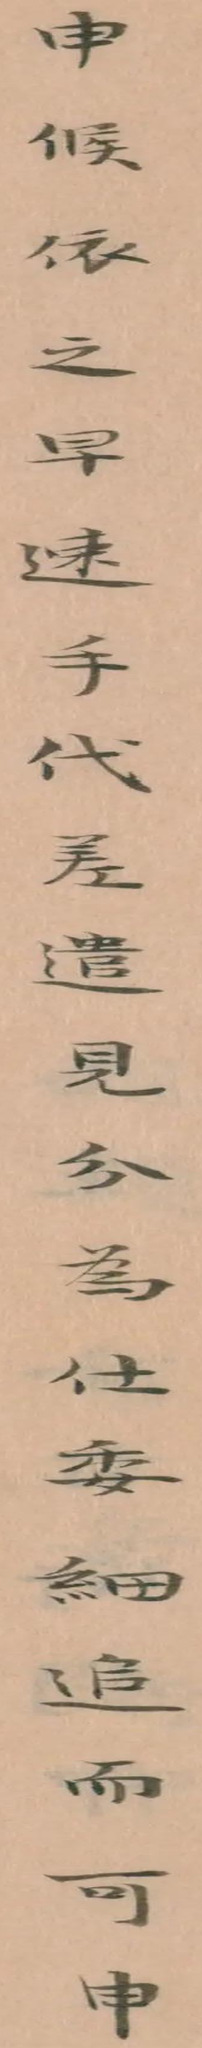申候依之早速手代差遣見分為仕委細追而可申
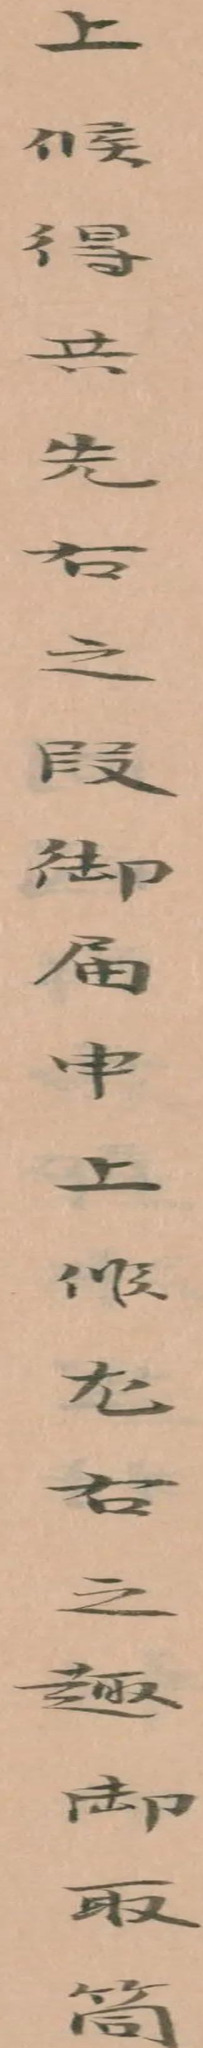上候得共先右之段御届申上候左右之趣御取箇
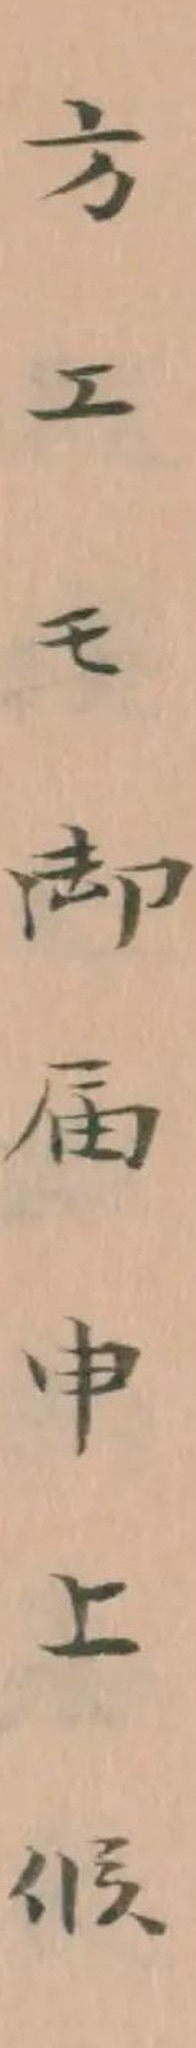方エモ御届申上候
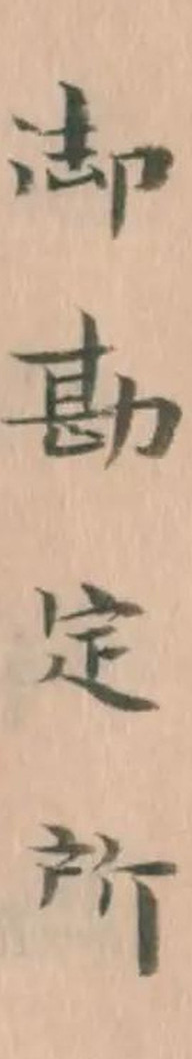御勘定所
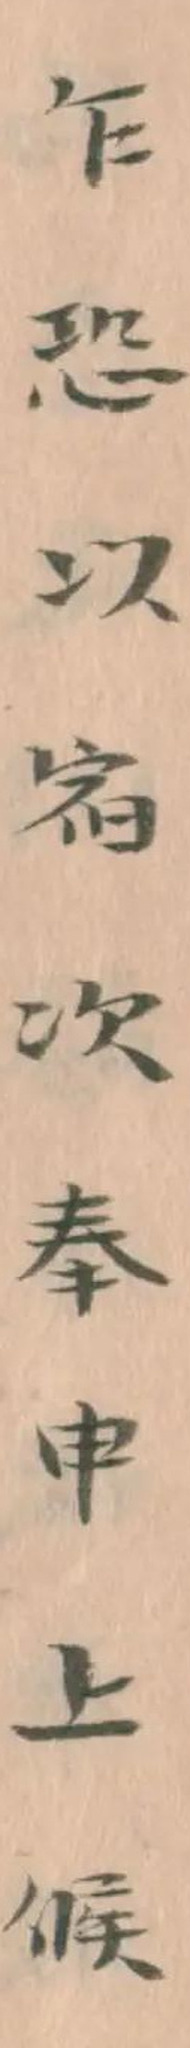乍恐以宿次奉申上候
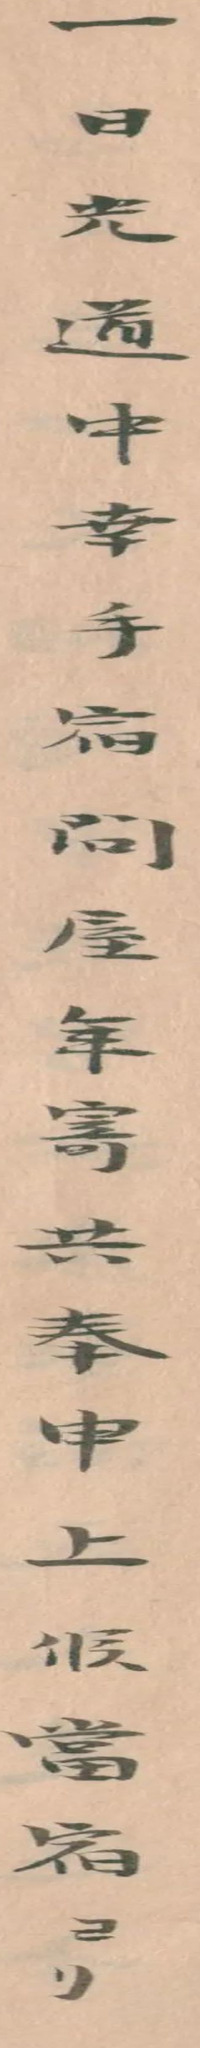一日光道中幸手宿問屋年寄共奉申上候当宿ヨリ
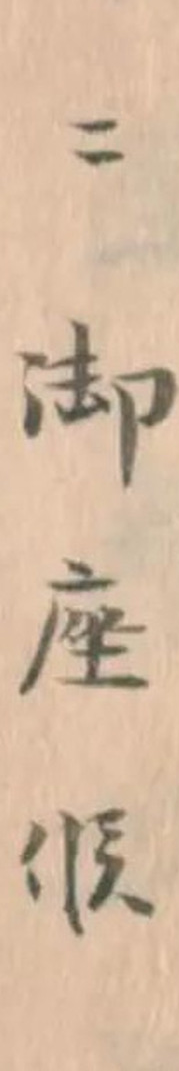二御座候
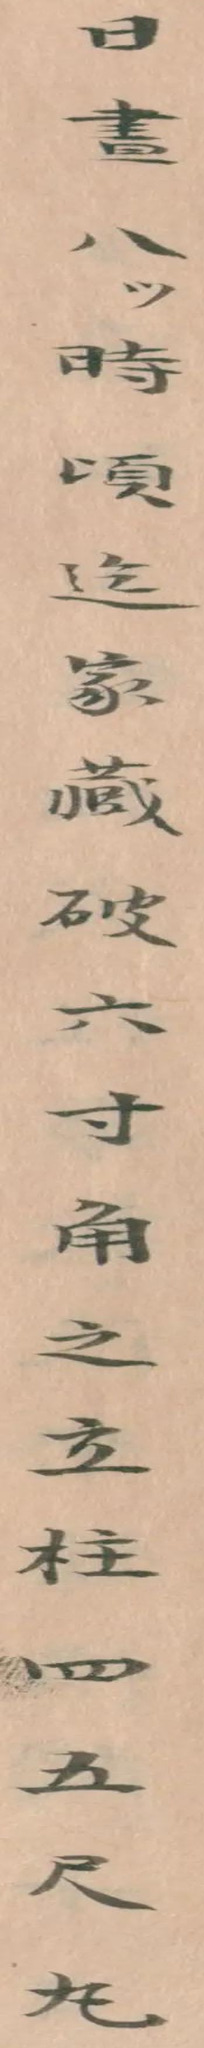日晝八ッ時頃迄家倉破六寸角之立柱四五尺丸
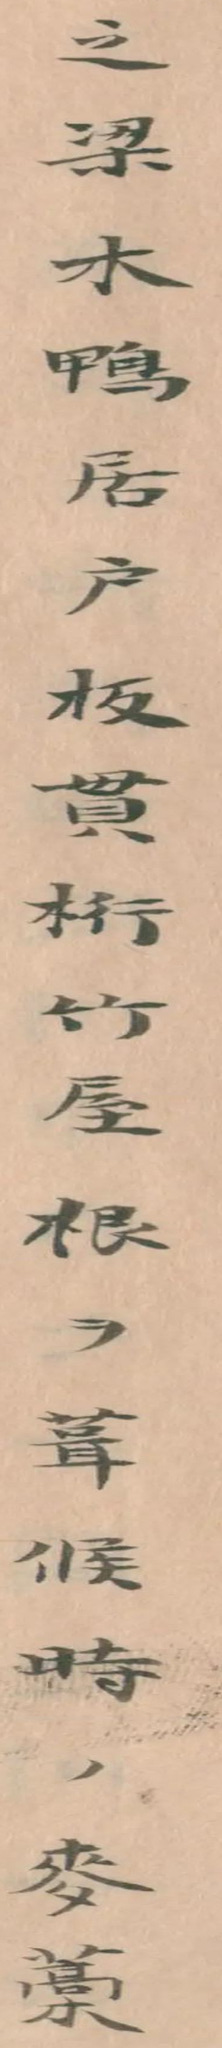之梁木鴨居戸板貫桁竹屋根ヲ葺候時ノ麦藁
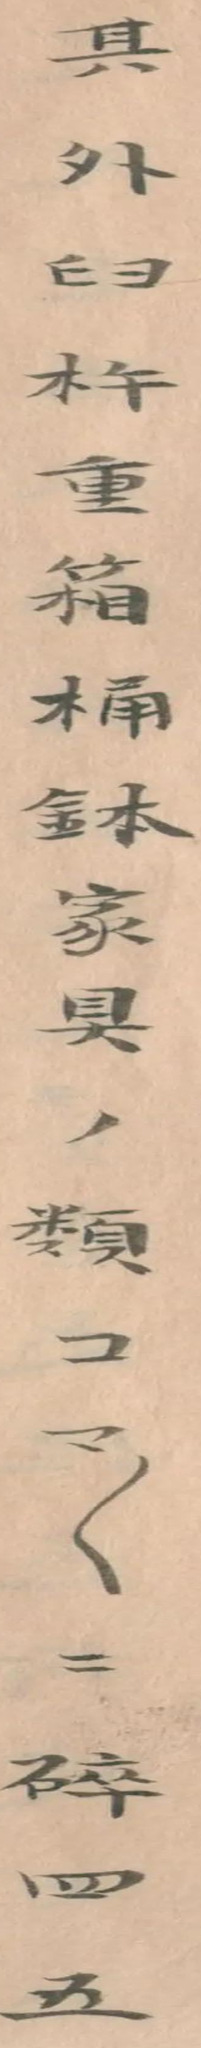其外臼杵重箱桶鉢家具ノ類コマ〳〵二砕四五

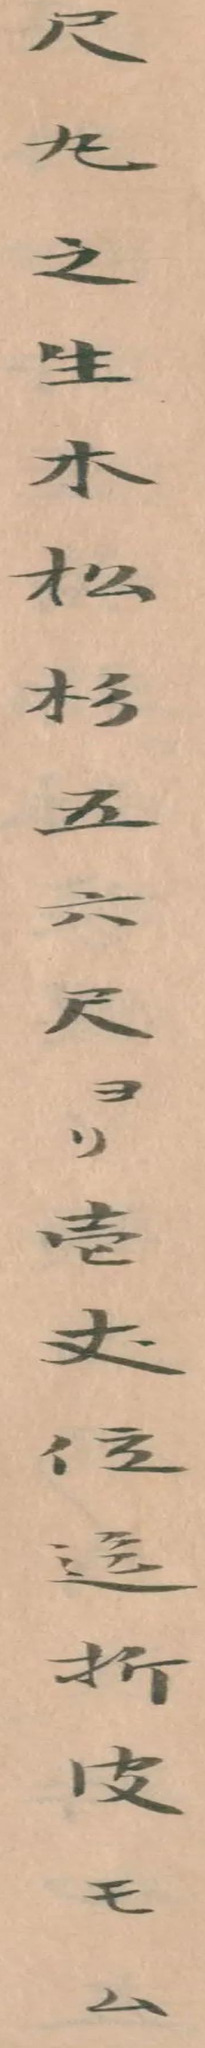尺丸之生木松杉五六尺ヨリ壱丈位迄折皮モム
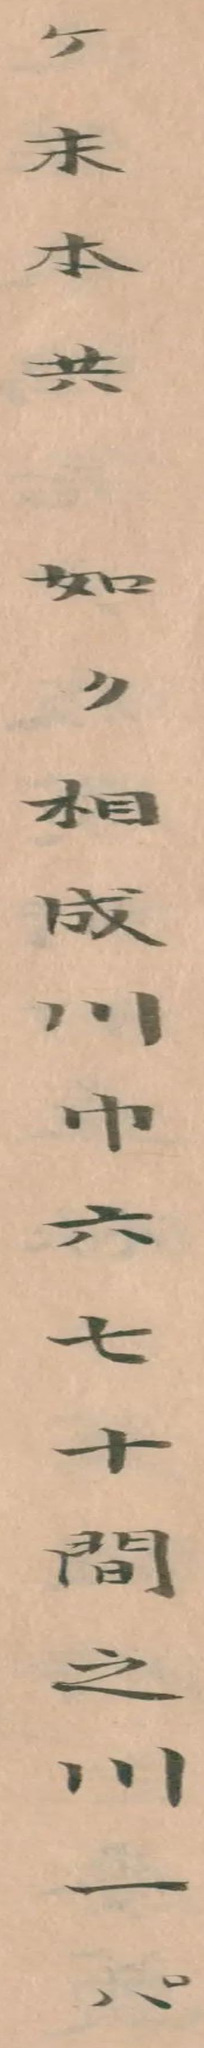ヶ未本共如ク相成川中六七十間之川一パ
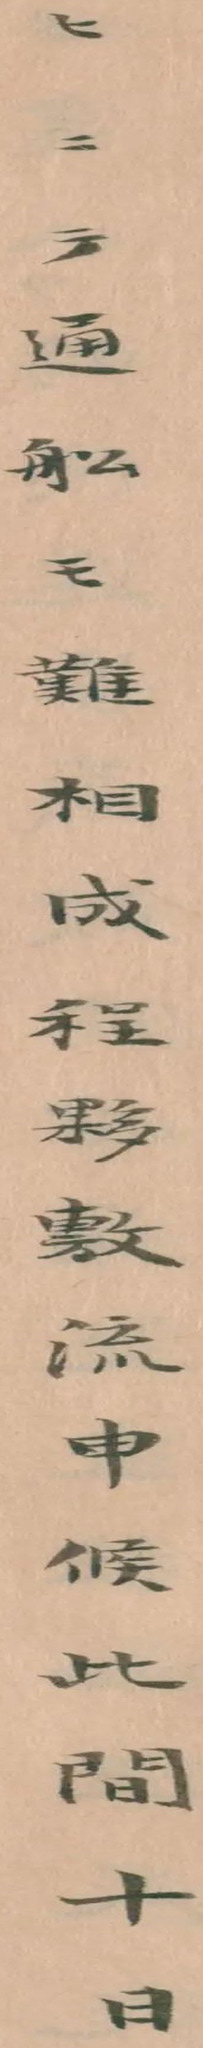ヒニテ通船モ難相成程夥敷流申候此間十日
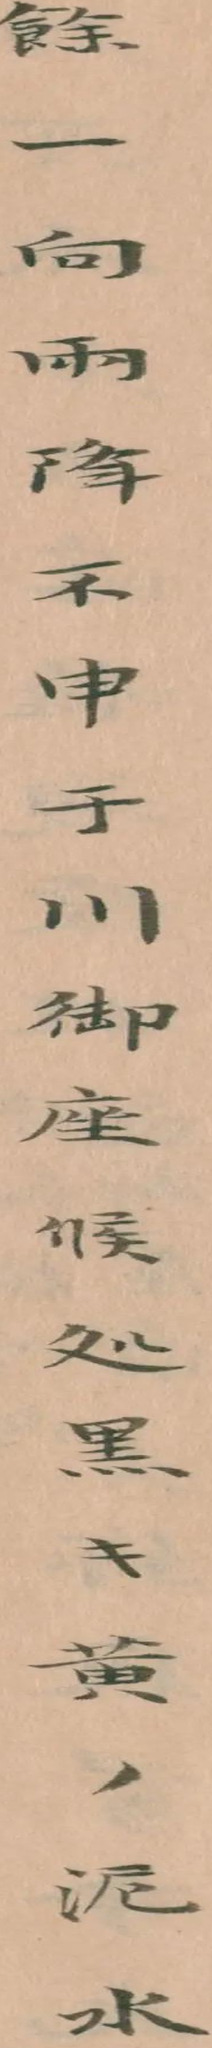余一向雨降不申干川御座候処黒キ黄ノ泥水
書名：地災撮要. 巻1(噴火山・地震ノ部)
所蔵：国立国会図書館 National Diet Library, JAPAN
